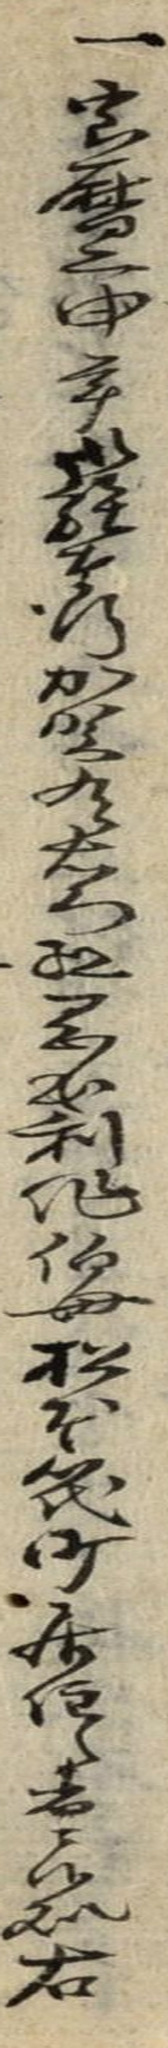一宝暦二申年御旗奉行加賀九郎右衛門組岡本利作伯母松本筏町居住之者に候処右
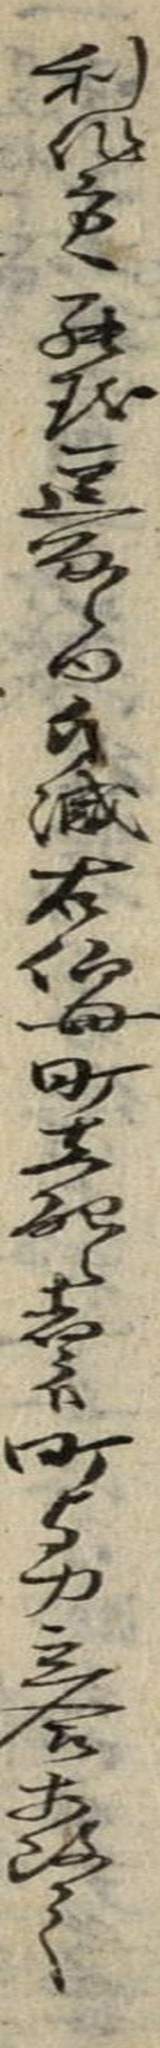利作方へ罷越逗留之内自滅右伯母町支配之者に付町与力立合相改之
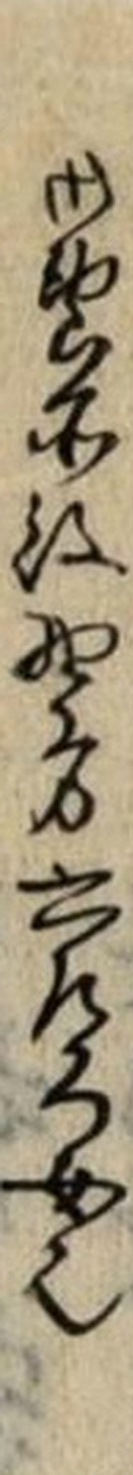御座所役西方六左衛門女也
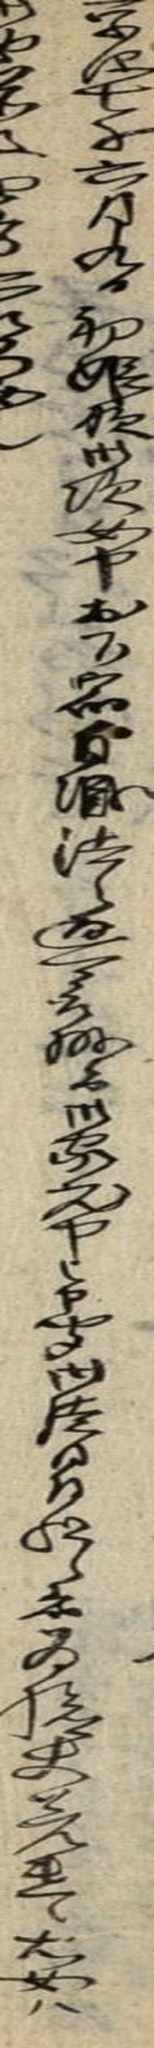一享保七刁六月九日初姫様御次女中於下宿自滅法之通可取扱旨御家老中被申聞御徒目付組之者為検使差遣候右女は
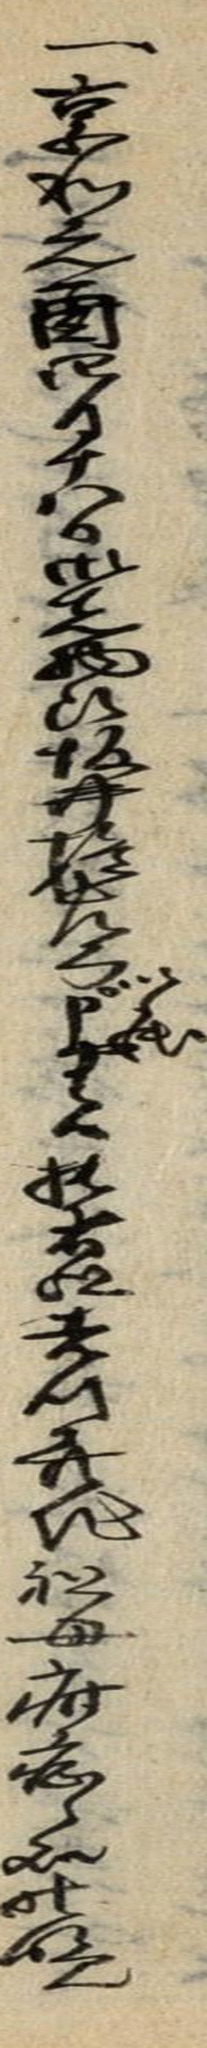一享和元酉四月十八日御先物頭坂井権左衛門◦申聞候は拙者組吉川喜作祖母疳症之処昨晩
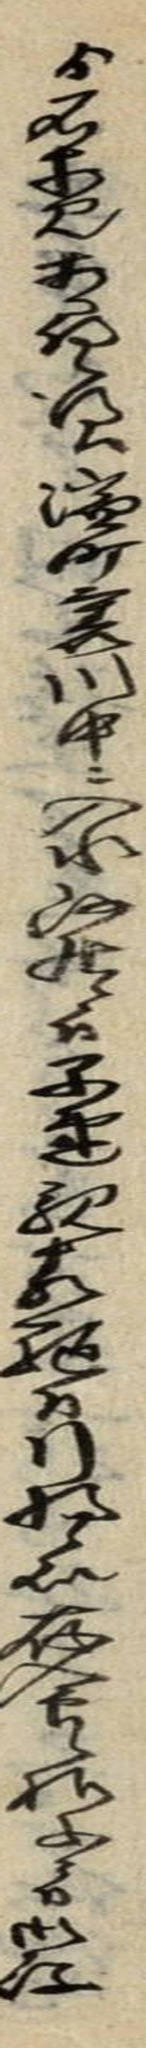ゟ不相見相尋候得は浜町裏川中に入水致居候に付早速親類駆付引揚候処存命之様子に付御役
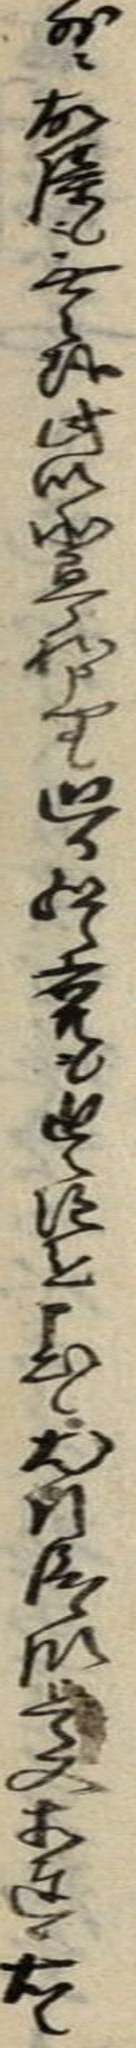外に故障も無之趣此段承置候様申聞候廻り組之者共も追々注進申出候尤引渡候段是又相達候右之
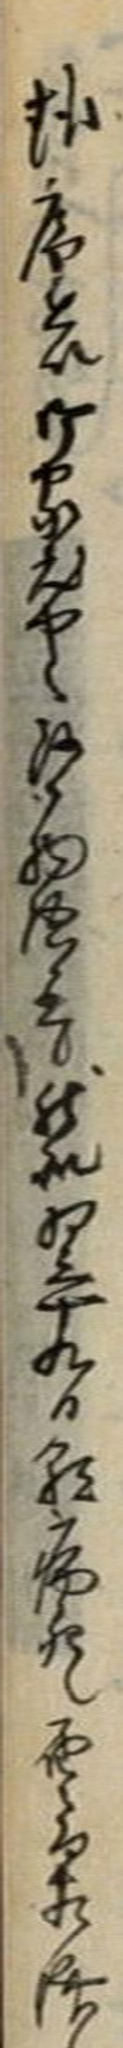趣序を以御家老中へ致御物語置候然処翌十九日朝病死之届にて相済候
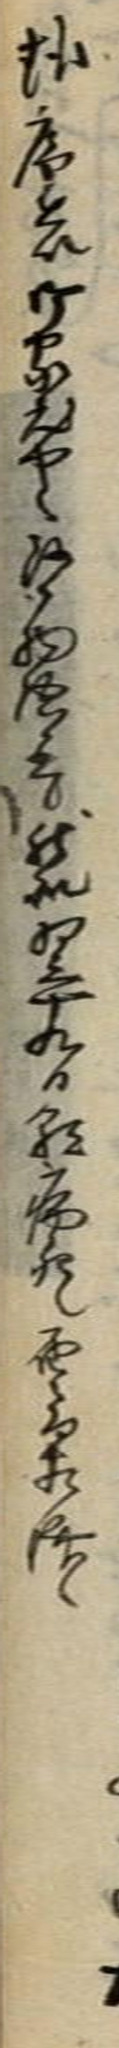趣序を以御家老中へ致御物語置候然処翌十九日朝病死之届にて相済候
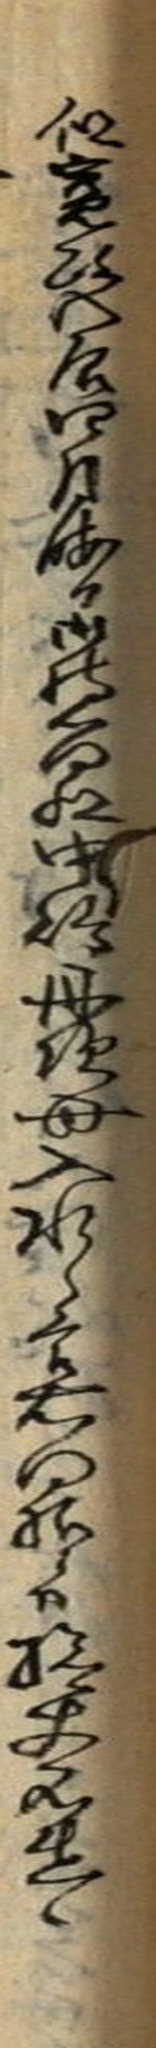但寛政八辰四月晦日御持筒組中島丹次母入水之節右同様に付検使不遣候
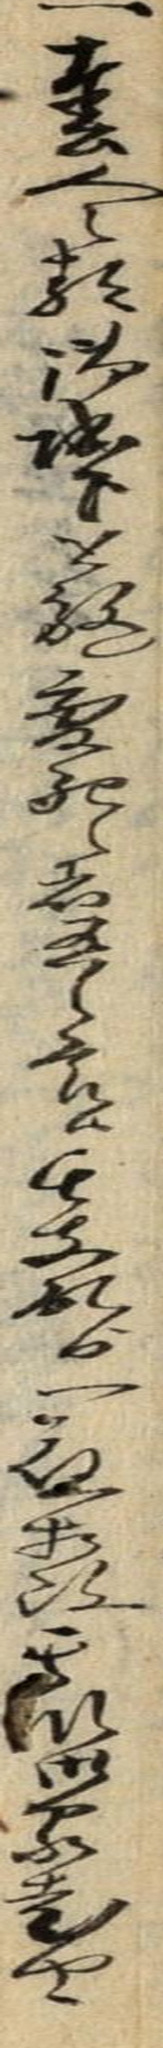一奉公人之類御城下を放レ変死之者有之節は其支配ゟ一応相改其段御家老中へ
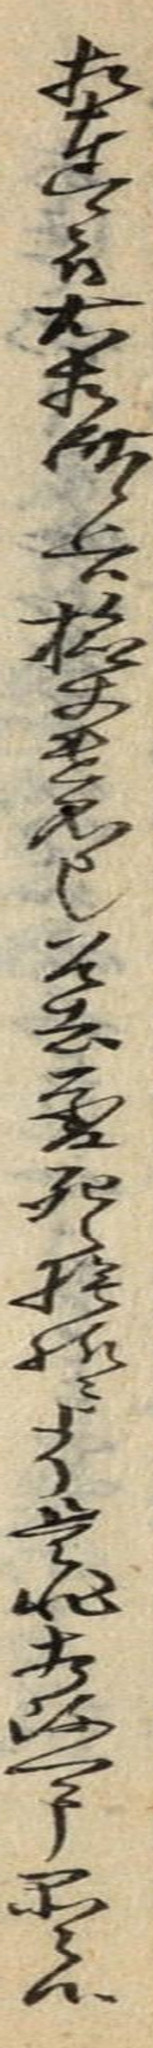相達候に付右相済候上は検使遣不申候乍去変死之模様により是非相改可申品に候
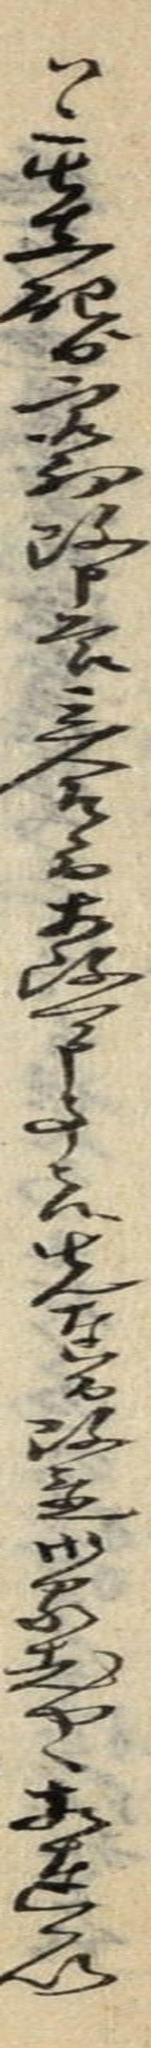はゝ其支配ゟ最初改申節立合候て相改可申事に候先達て改置御家老中へ相達候以
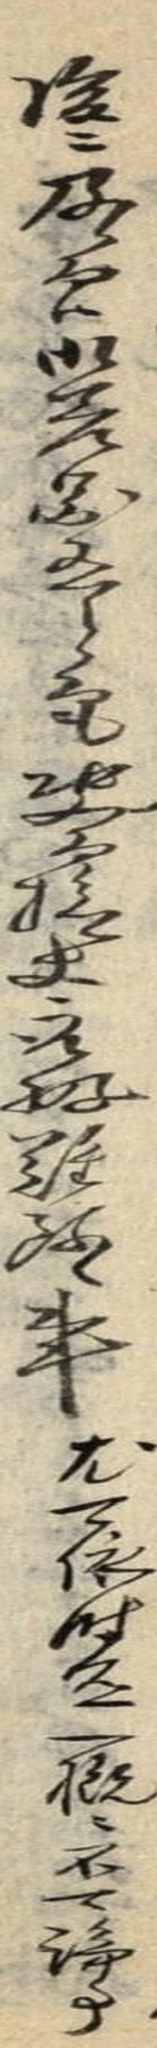後に及候ては御差図有之候ても決て検使取扱難致候事尤可依時宜一概に不可論事
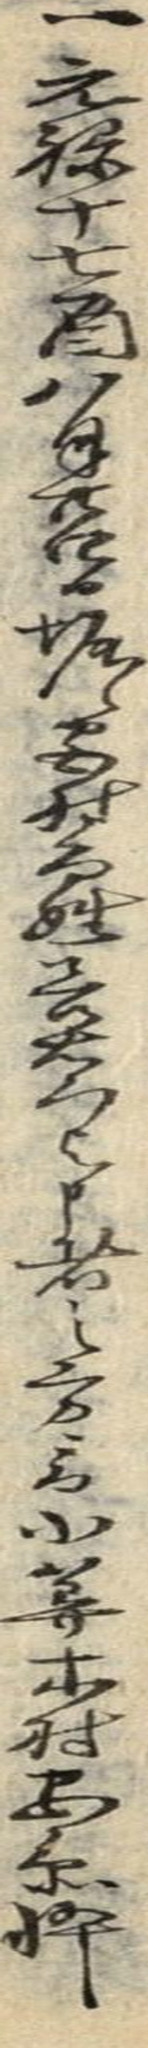一元禄十七酉八月廿四日堀之宮村百姓善右衛門と申者之方にて小算木村安兵衛悴
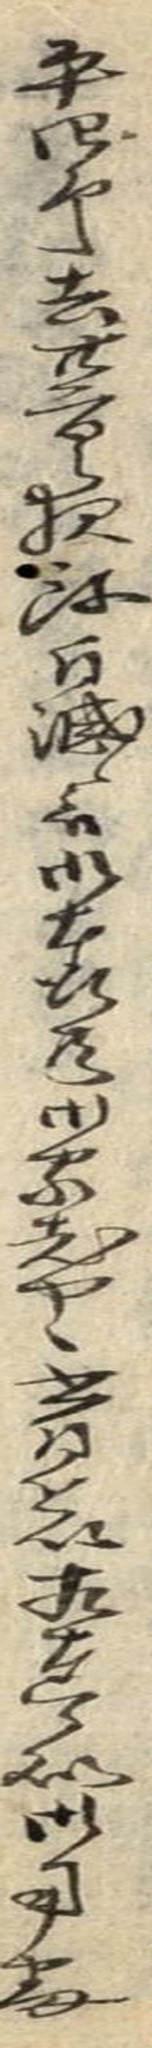平四郎去廿二日之夜致自滅候に付御奉行共御家老中へ書付を以相達候処御用番
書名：御停止異変死失
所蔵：福井県文書館 Fukui Prefectural Archives
